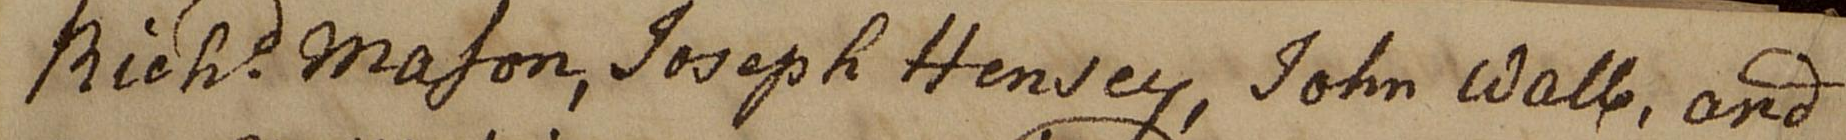Rich^d. Mason, Joseph Hensey, John Wall, and
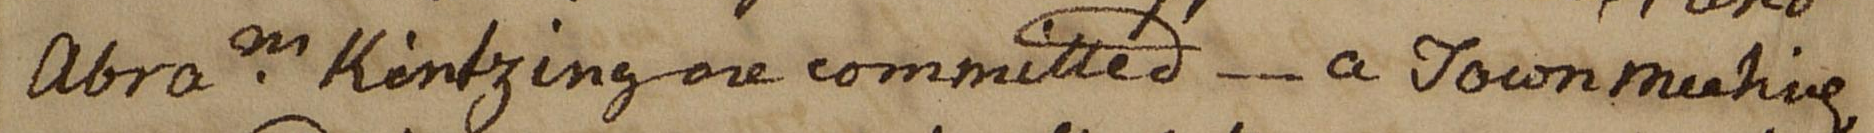Abra^m. Kintzing are committed- a Town meeting
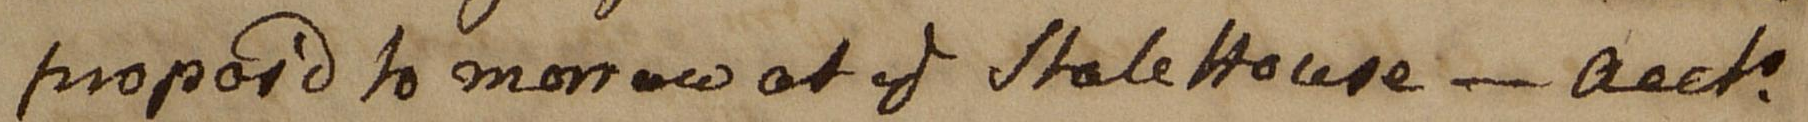propos'd to morrow at y^e Stale House- acct^s.
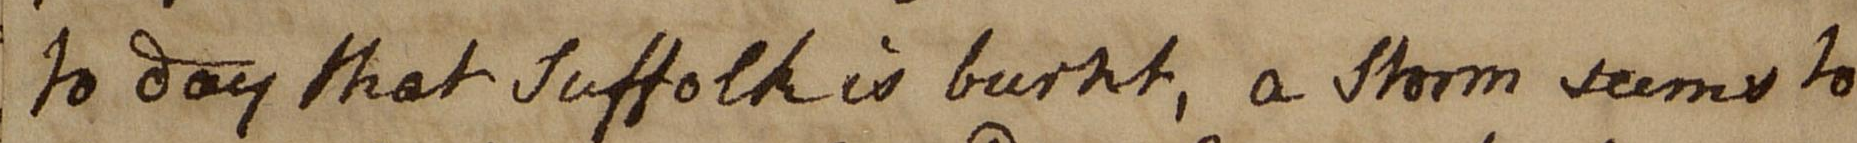to day that Suffolk is burnt, a Storm seems to
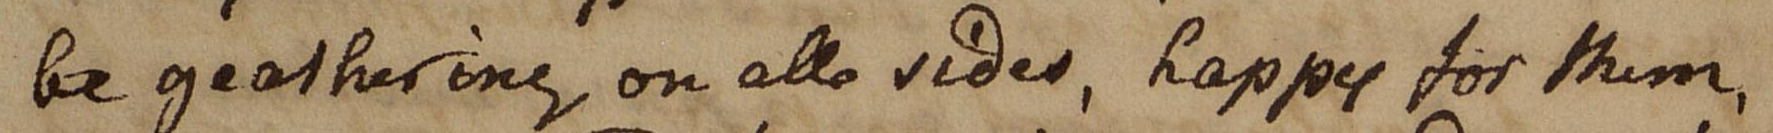be geathering on all sides, happy for them,
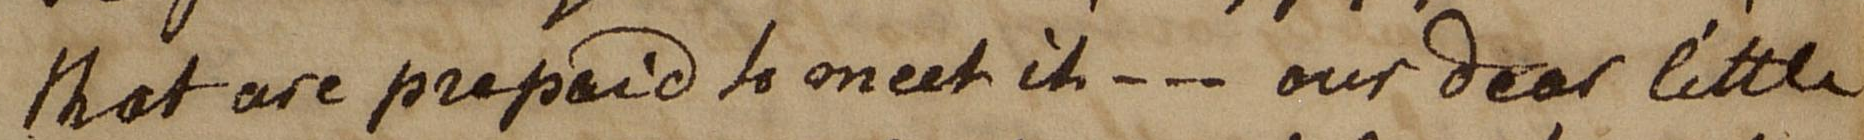that are prepar'd to meet it-- our dear little
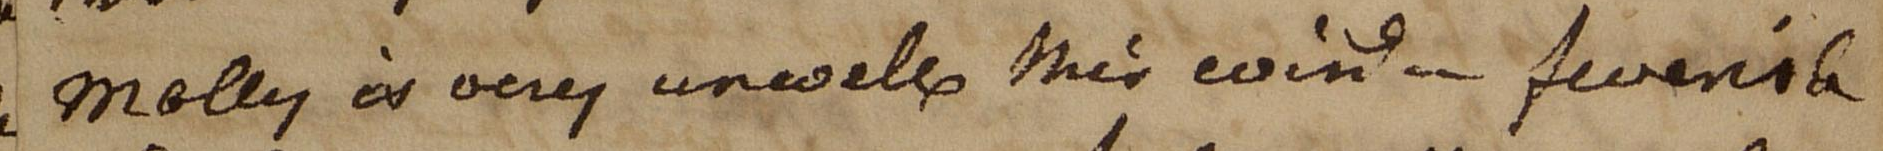Molly is very unwell this evin^g- feverish
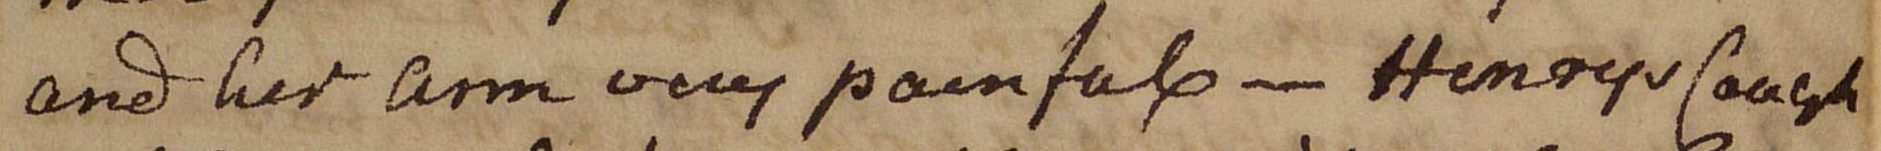and her arm very painful- Henrys Cough
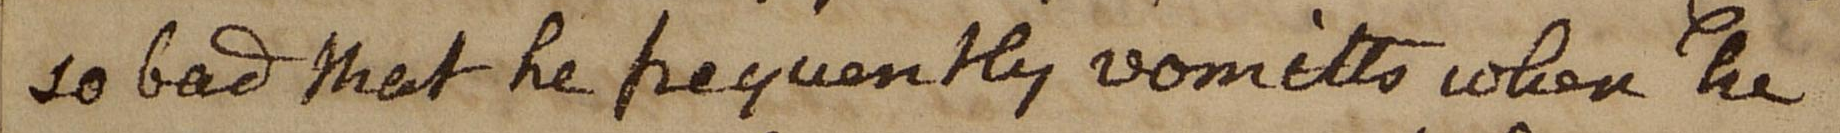so bad that he frequently vomitts when he
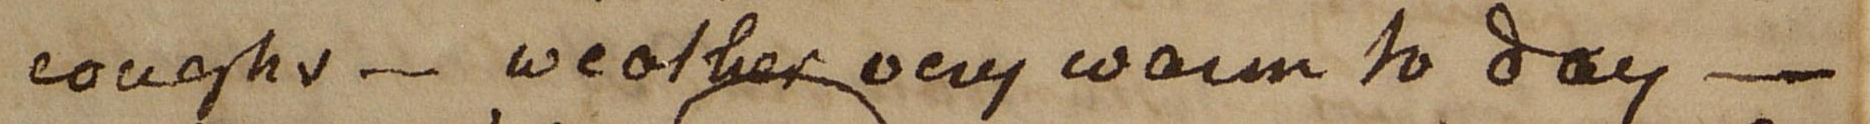coughs- we at her very warm to day-
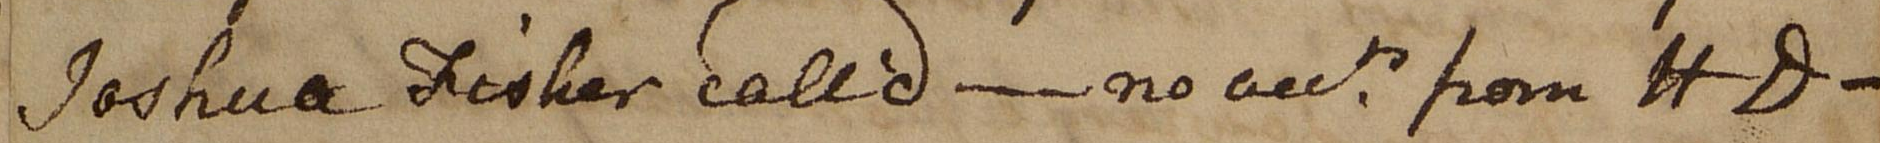Joshua Fisher call'd- no acc^ts. from HD-
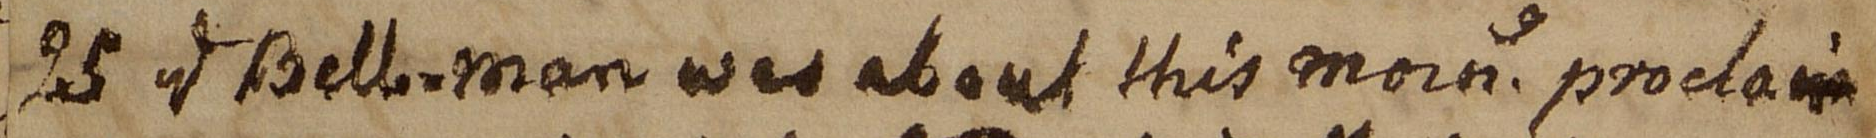25 y^e Bell-Man was about this morn^g. proclaim
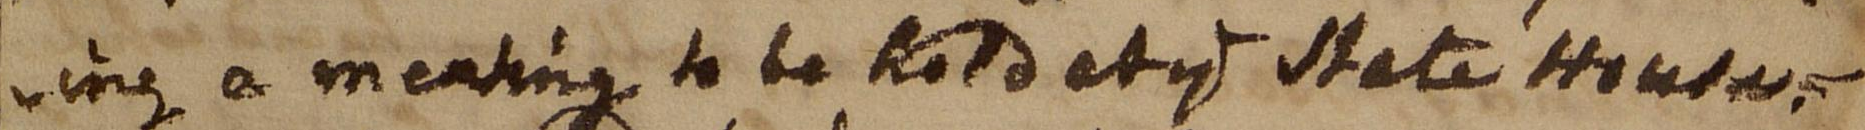-ing a meting to be hold at y^e State Houses.-
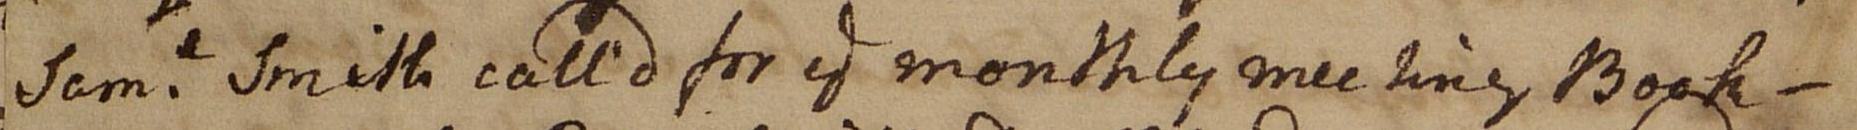Sam^l. Smith call'd for y^e monthly meeting Book-
